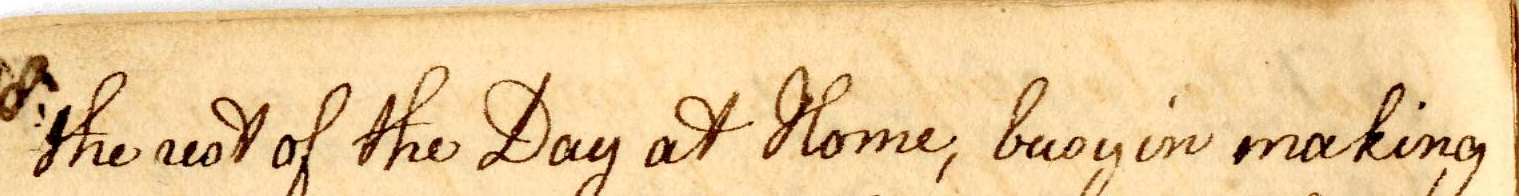the rest of the Day at Home, busy in making
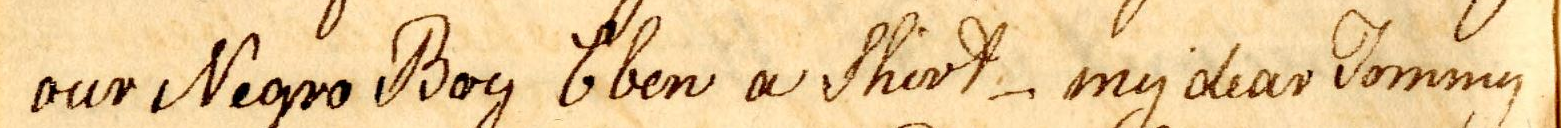our Negro Boy Eben a Shirt- my dear Tommy
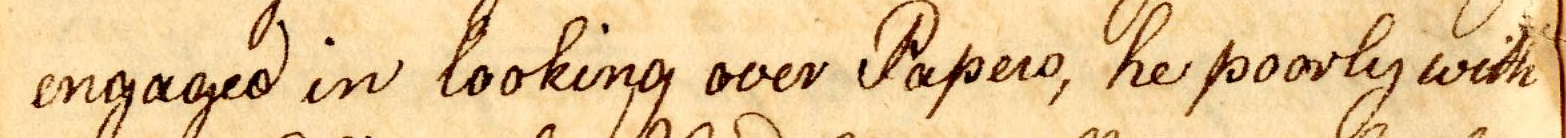engaged in looking over Papers, he poorly with
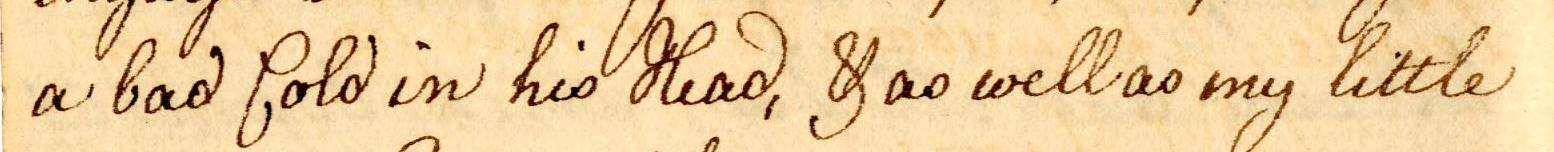a bad Cold in his Head, & as well as my little
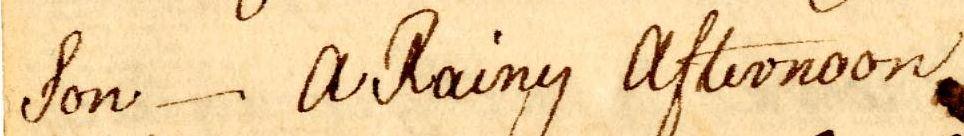Son- A Rainy Afternoon
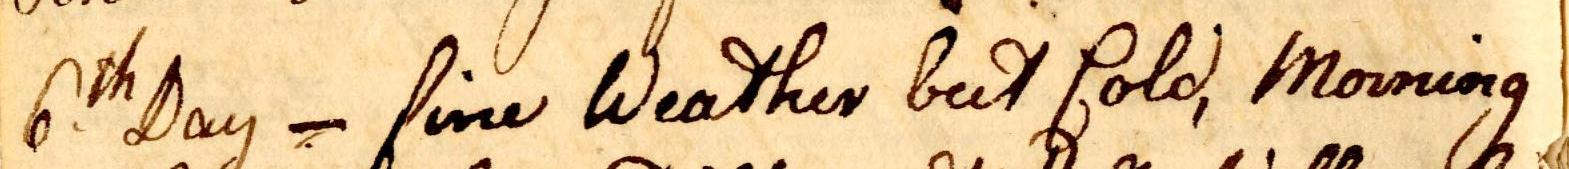6^th Day- fine Weather but Cold, Morning
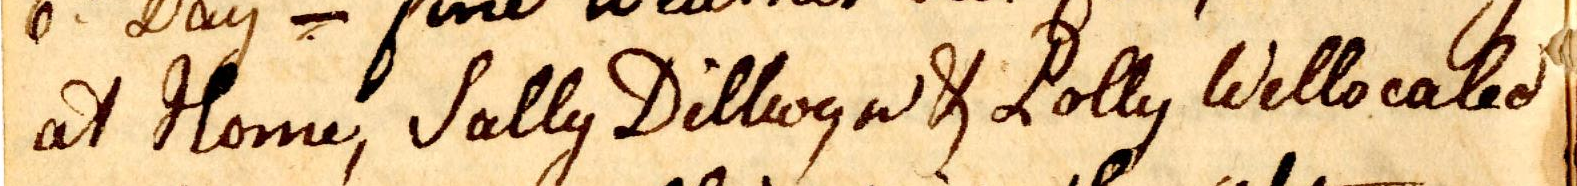at Home, Sally Dillwyn & Polly Wells caled
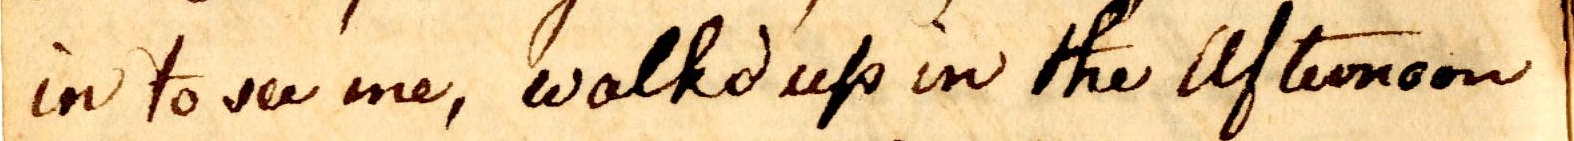in to see me, walkd up in the Afternoon
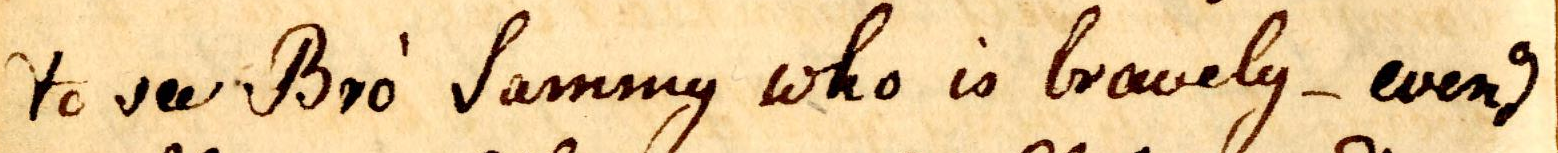to see Bro' Sammy who is bravely- even^g
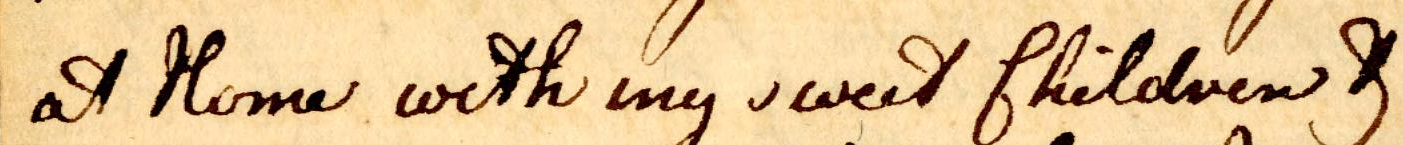at Home with my sweet Children &
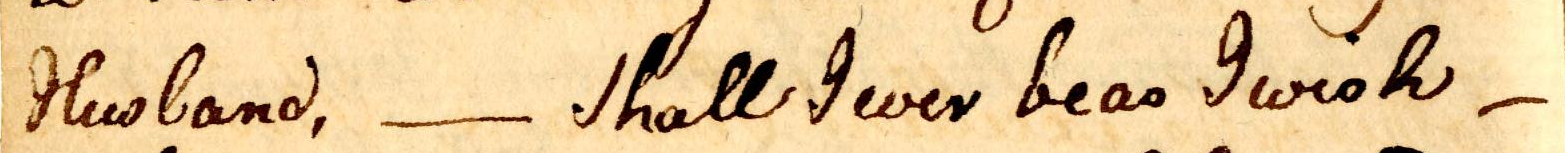Husband,- Shall I ever be as I wish-
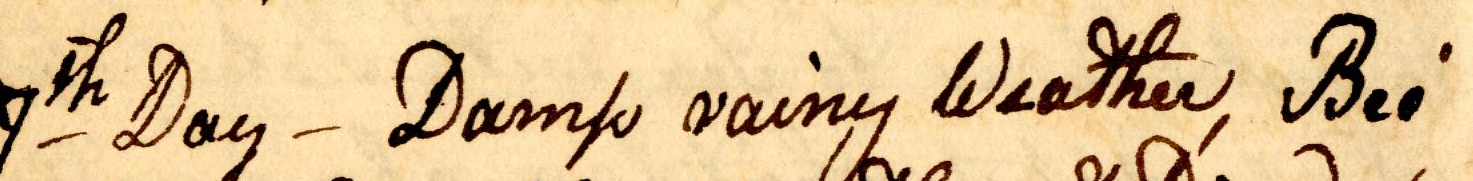7^th Day- Damp rainy Weather, Bro'
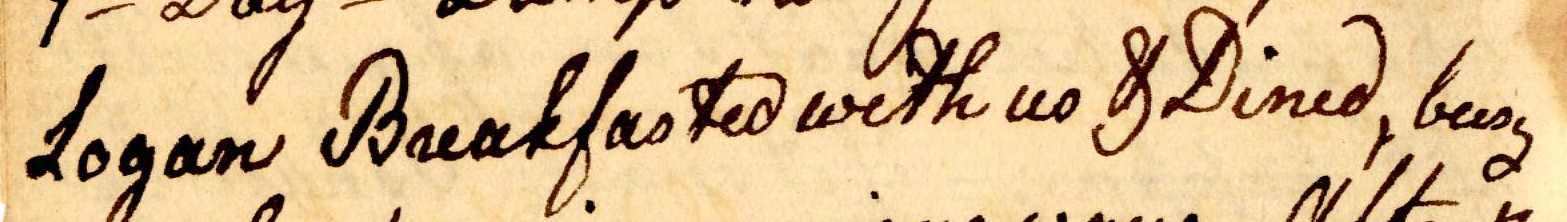Logan Breakfasted with us & Dined, busy
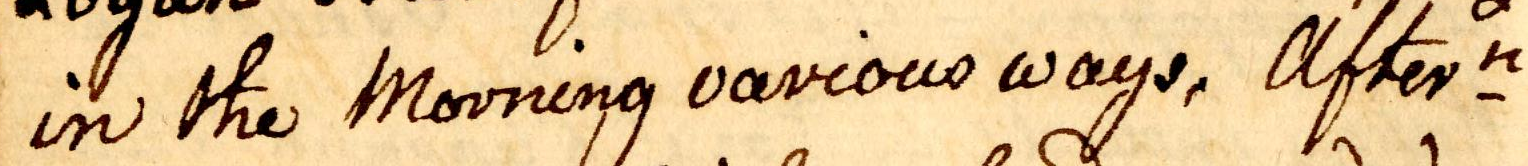in the Morning various ways, After n
